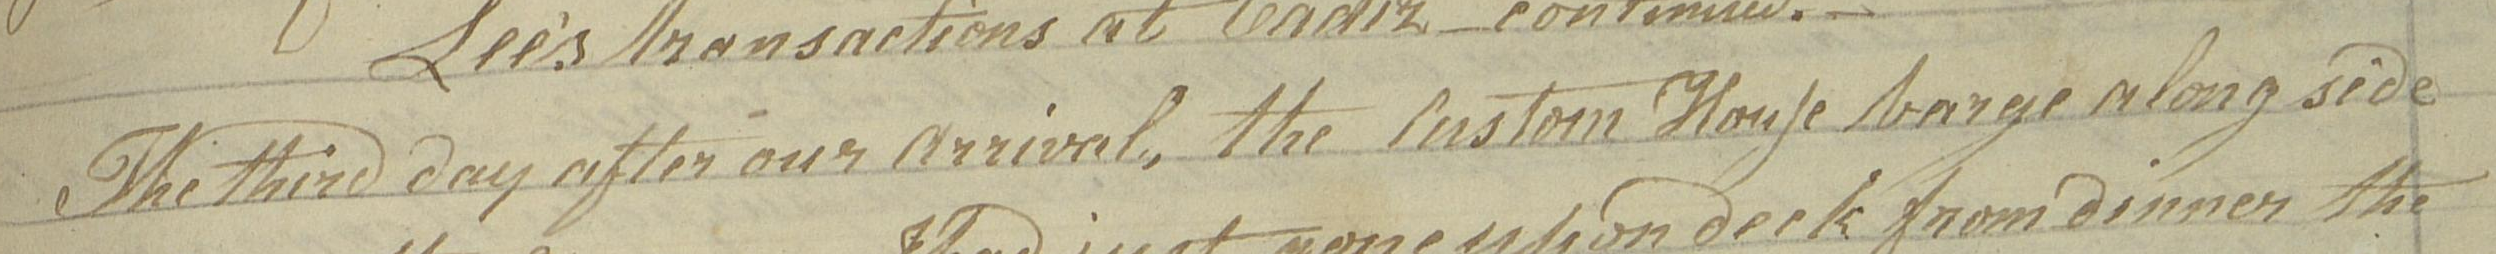The third day after our arrival, the custom House barge along side
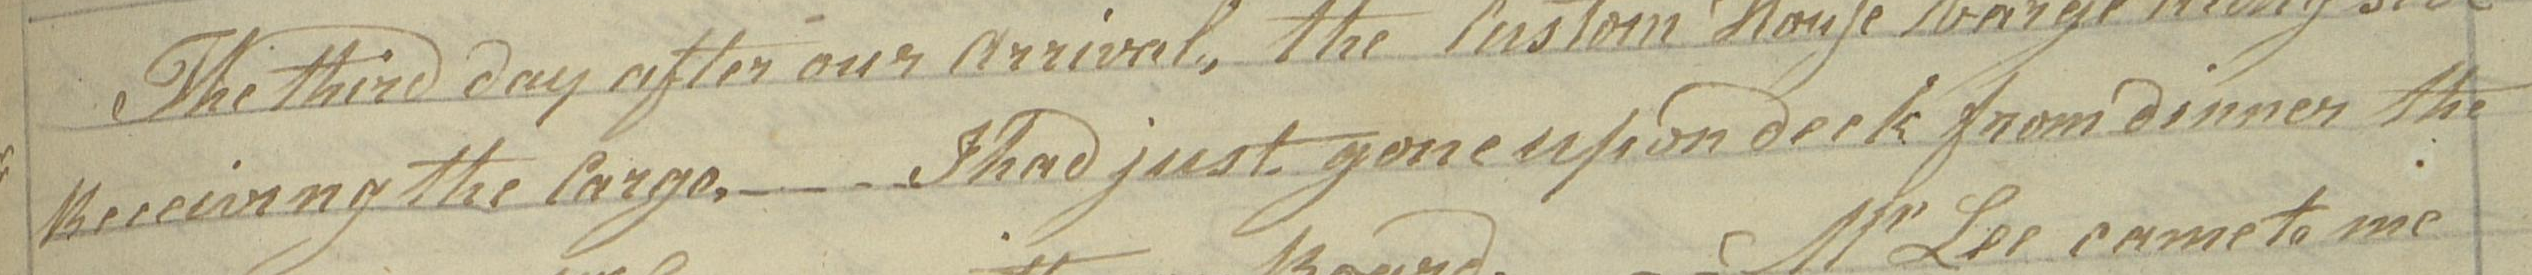Receiving the Cargo, I had just gone upon deck from dinner the
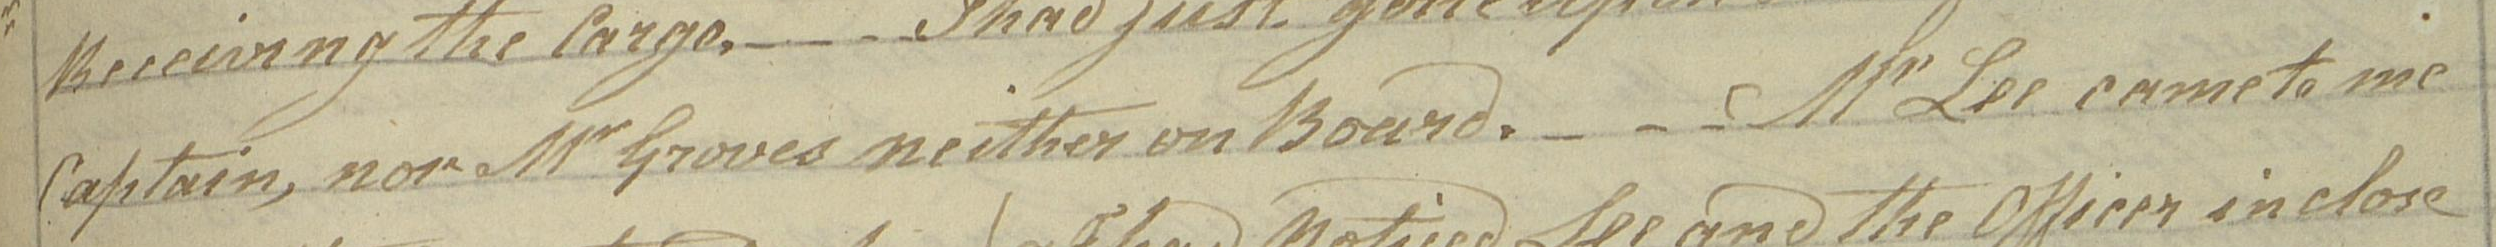Captain, nor M^r. Groves neither on Board. M^r. Lee came to me
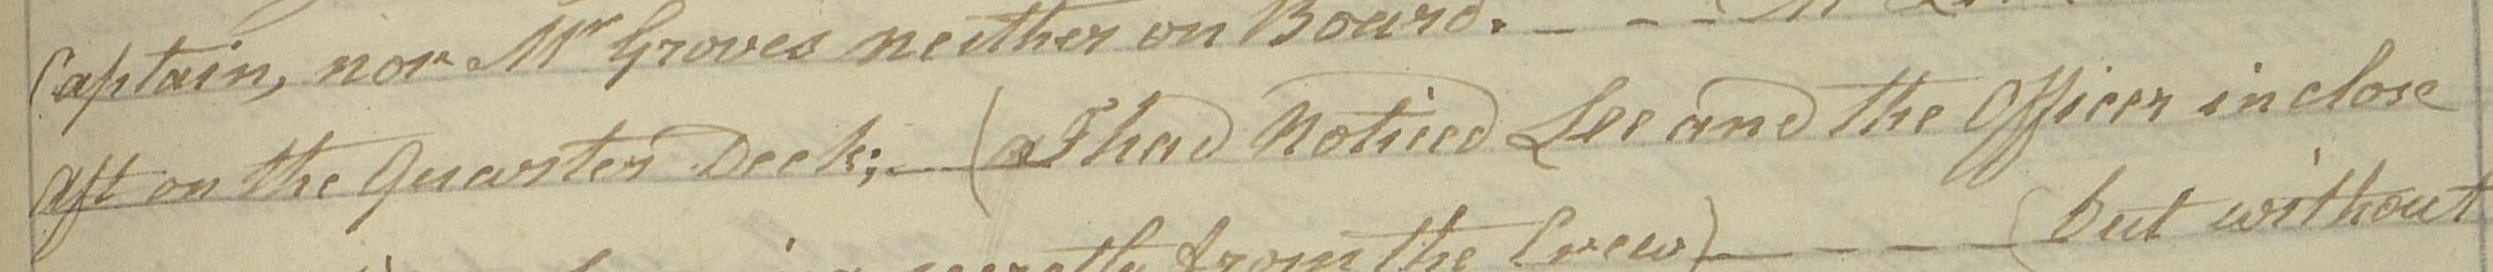aft on the Quarter Deck; (I had Noticed Lee and the Officer inclose
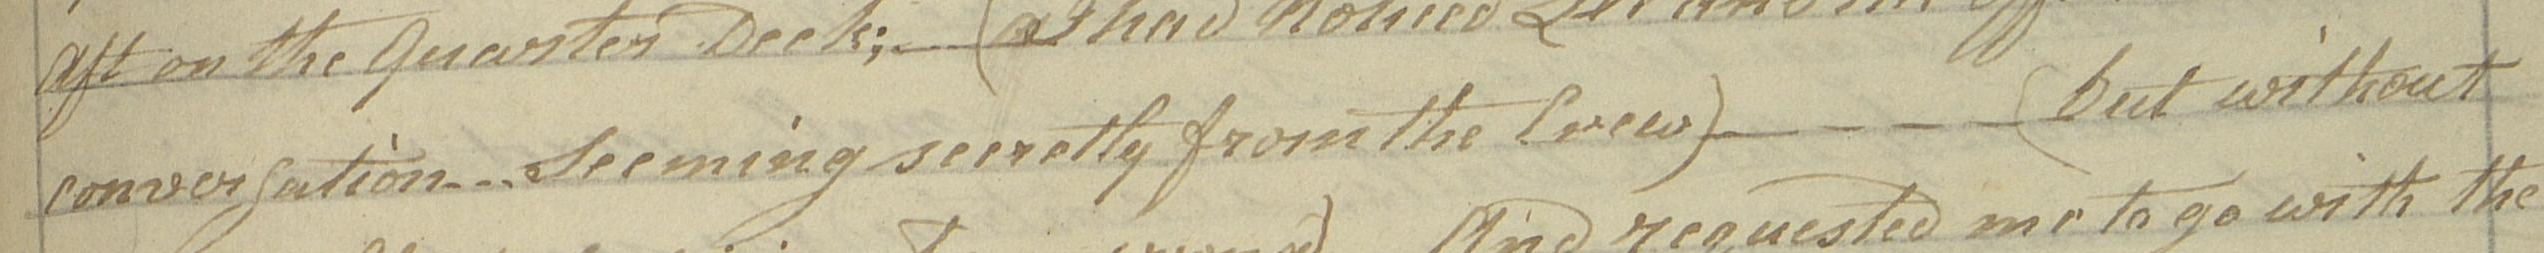conversation. Seeming secretly from the Crew) (but without
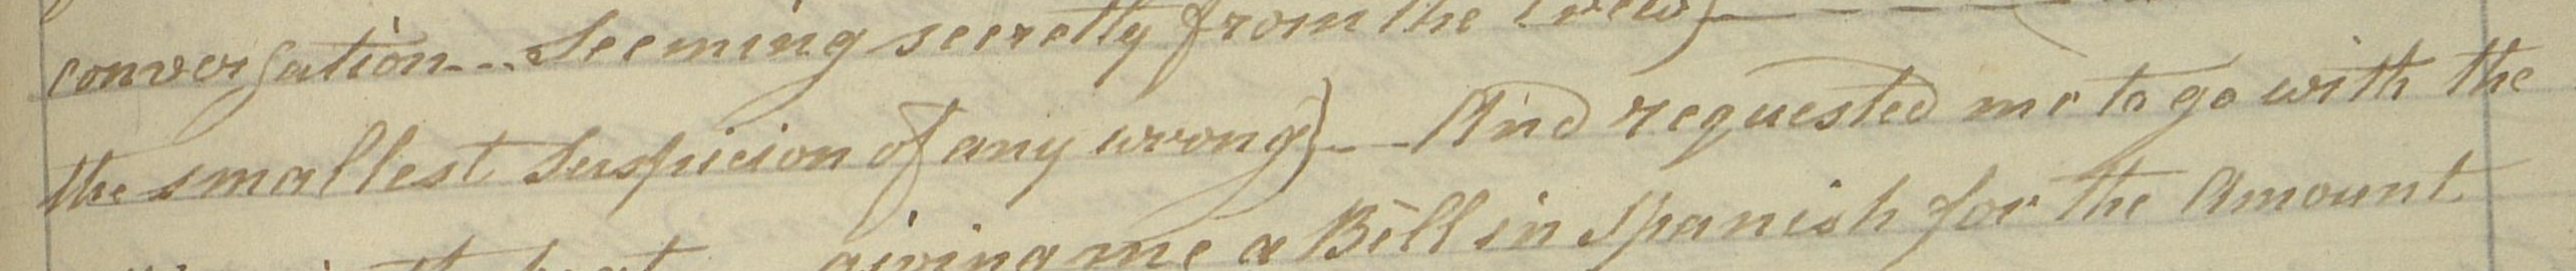the smallest Suspicion of my wrong) And requested me to go with the
